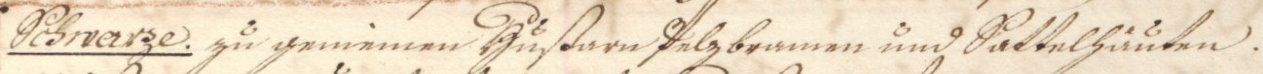Schwarze. zu gemeinen Hußarn Pelzbramen und Sattelhäuten.
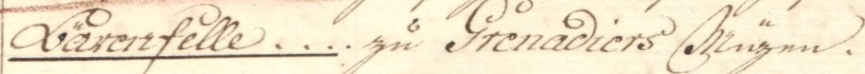Bärenfelle... zu Grenadiers Müzen.
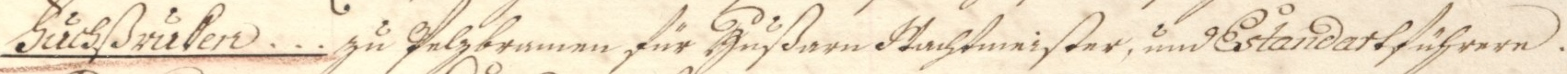Fuchßruken... zu Pelzbramen für Hußarn Wachtmeister, und Estandartführern.
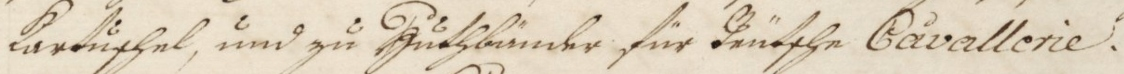Kartuschel, und zu Huthbänder für Teütsche Cavallerie.
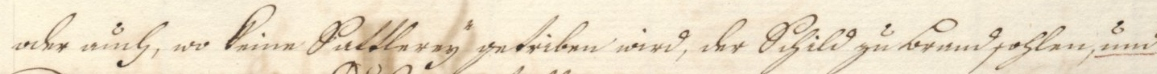oder auch, wo keine Sattlerey getriben wird, der Schild zu Brundsohlen, und
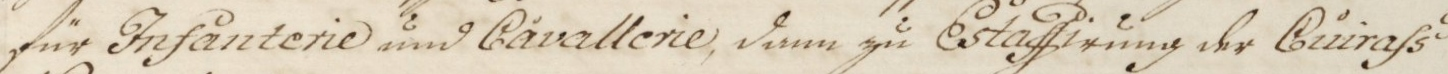für Infanterie und Cavallerie, dann zu Estaffirung der Cuirass
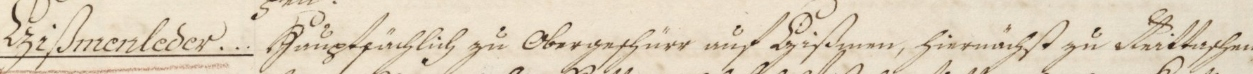Czißmenleder... Hauptsächlich zu Obergeschürr auf Czißmen, hiernächst zu Reittaschen
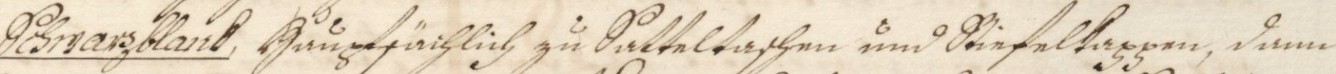Schwarzblank, Hauptsächlich zu Satteltaschen und Stiefelkappen, dann
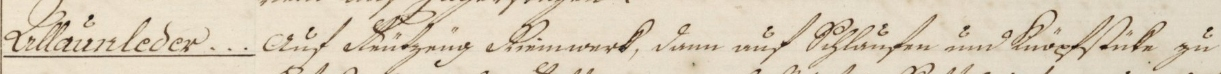Allaunleder... Auf Reützeüg Riemwerk, dann auf Schlaufen und Knöpfstüke zu
